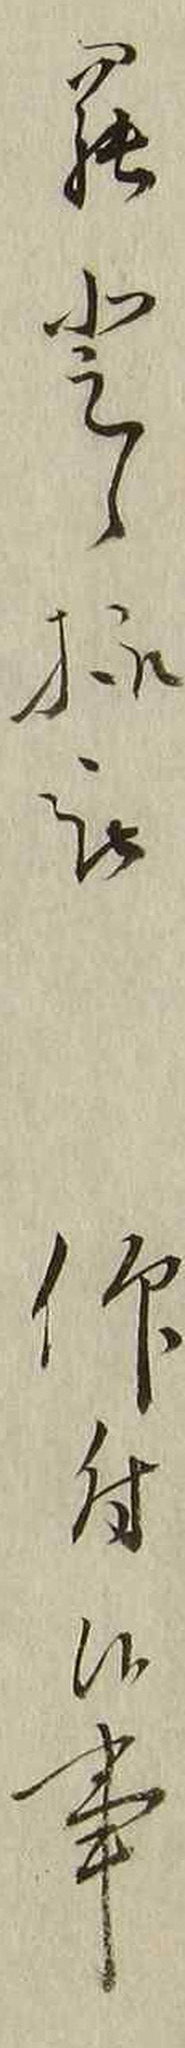罷登候様被仰付候事
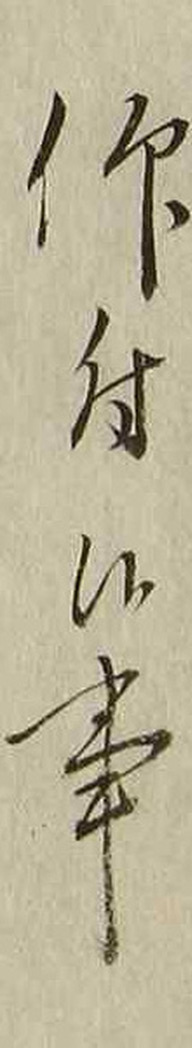仰出候事
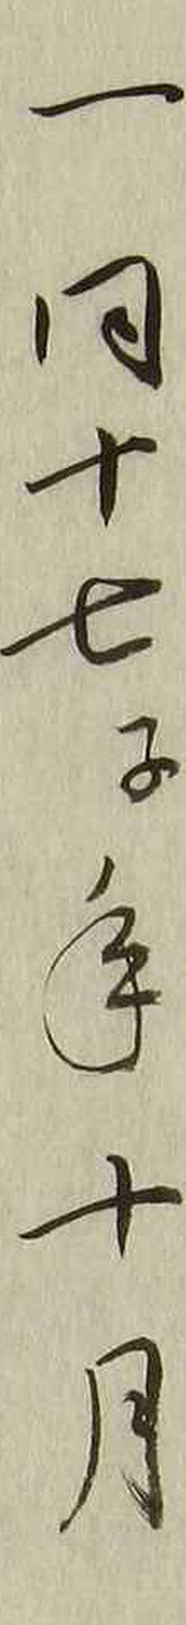一同十七子年十月被
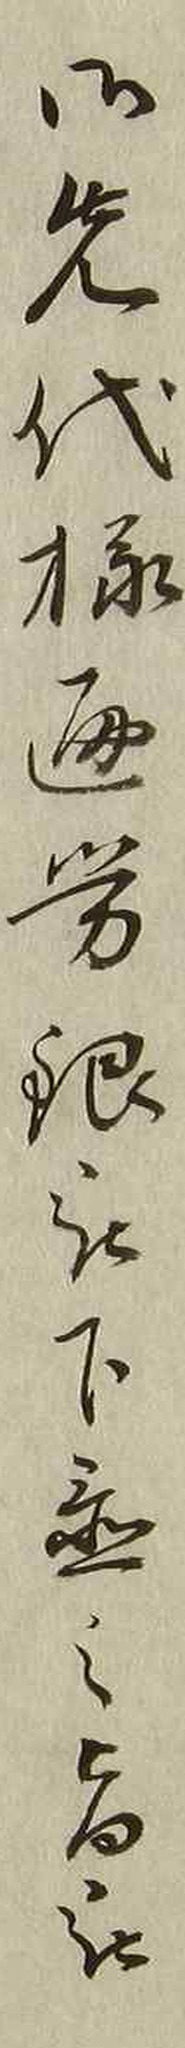御先代様通労銀被下置之旨
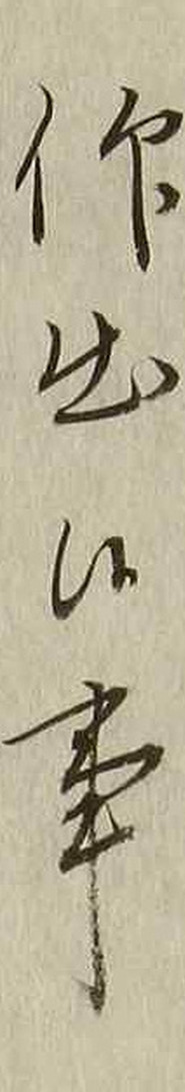仰出候事
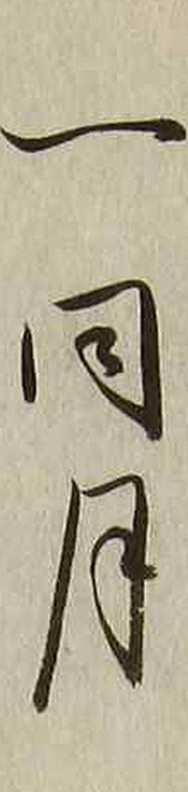一同月
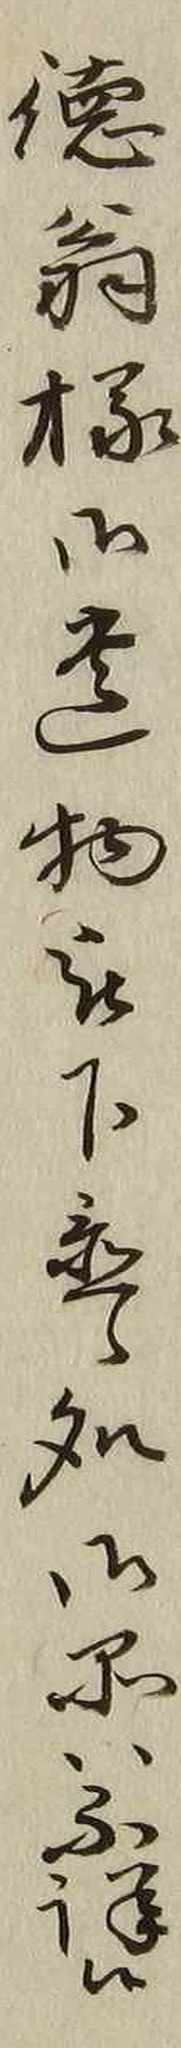徳翁様御遺物被下置候処御品ハ不詳候
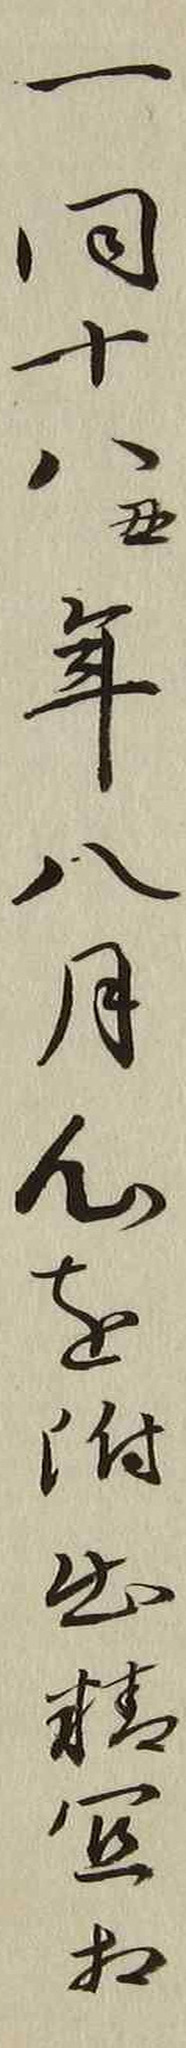一同十八丑年八月心附出精宜相
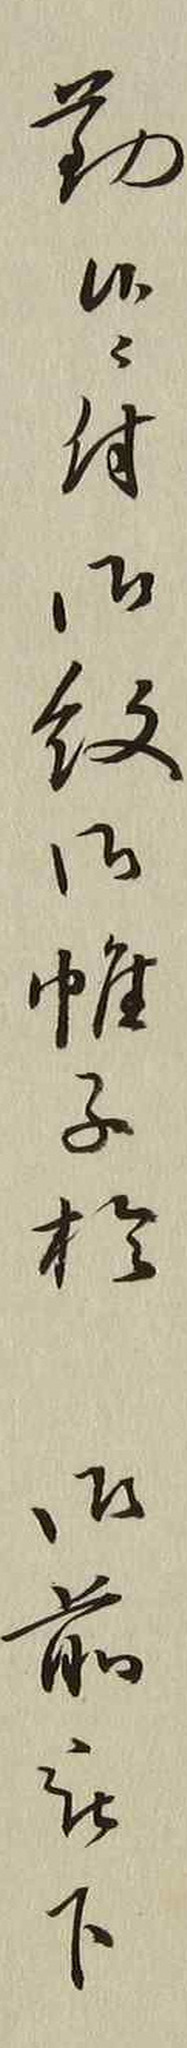勤候ニ付御紋御帷子於御前被下
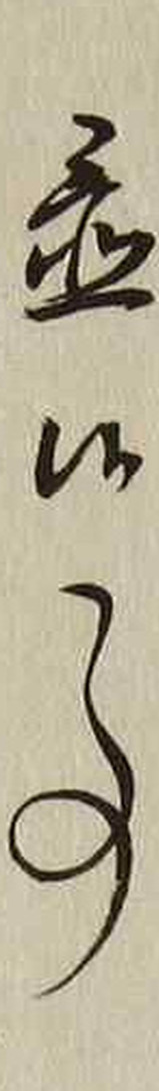置候事
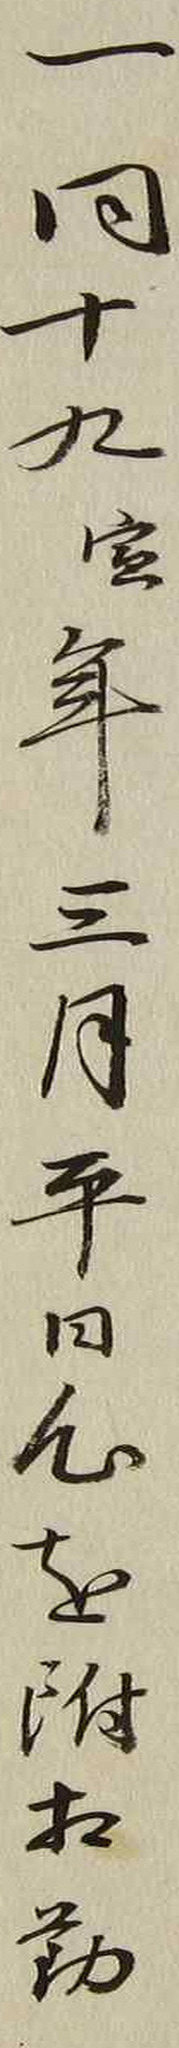一同十九寅年三月平日心を附相勤
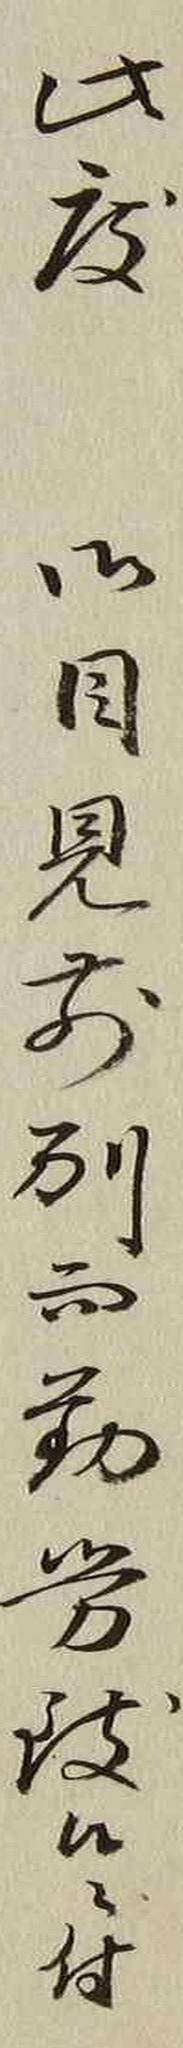此度御目見前列而勤労致候ニ付
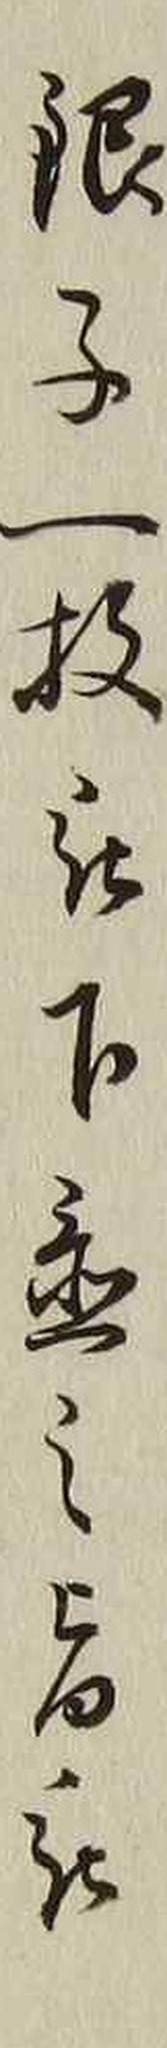銀子一枚被下置之旨被仰出候事
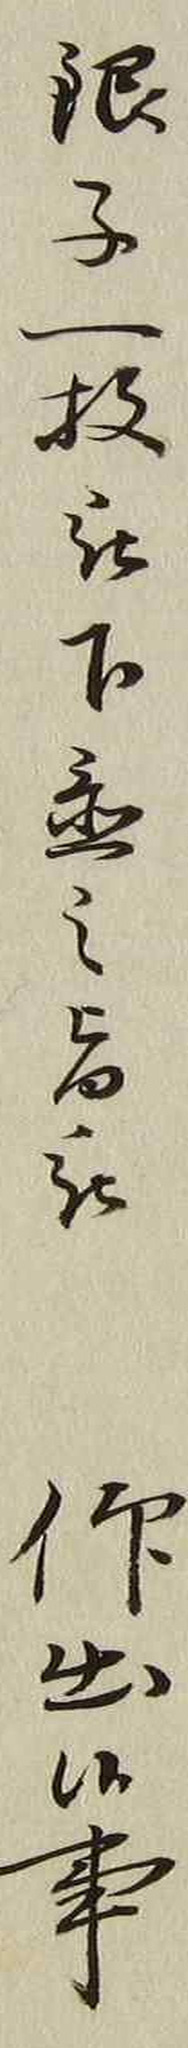銀子一枚被下置之旨被仰出候事
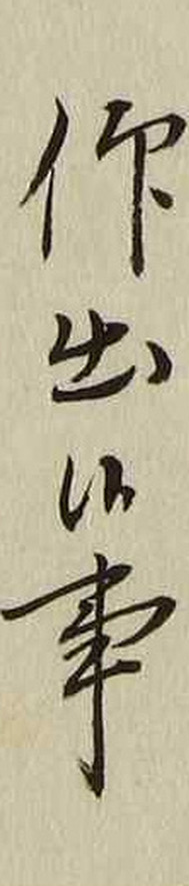仰出候事
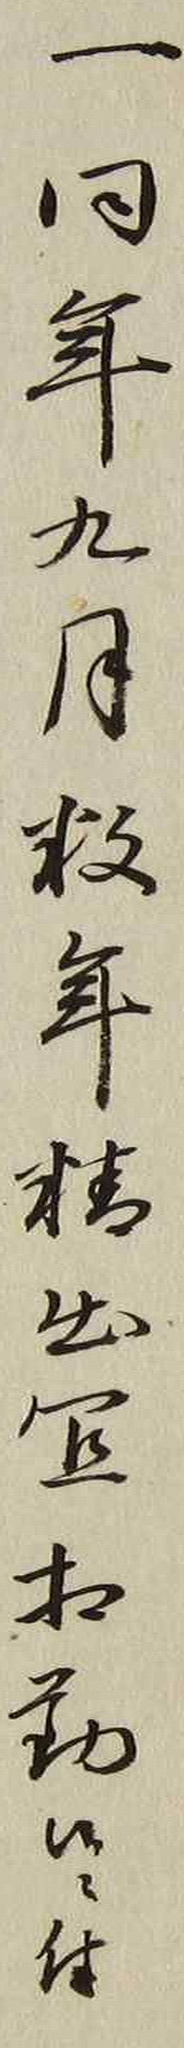一同年九月数年精出宜相勤候ニ付
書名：諸士系譜　巻之19　い之部19
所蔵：会津若松市立会津図書館
